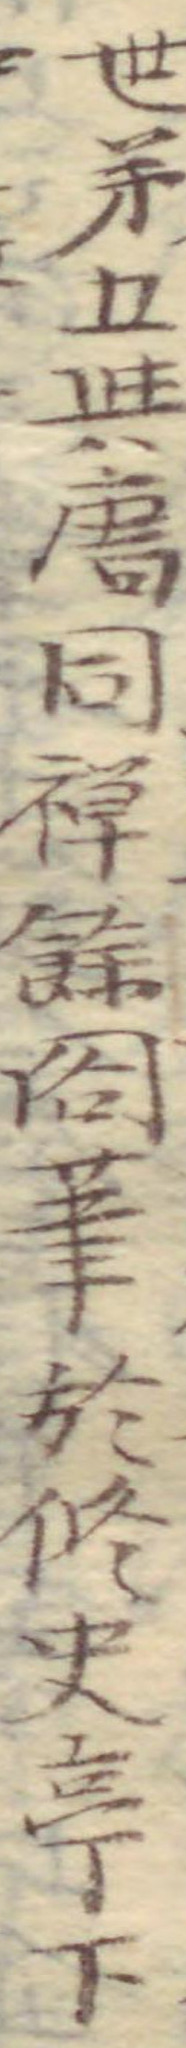世第五与庸同禅余閣筆於修史亭下
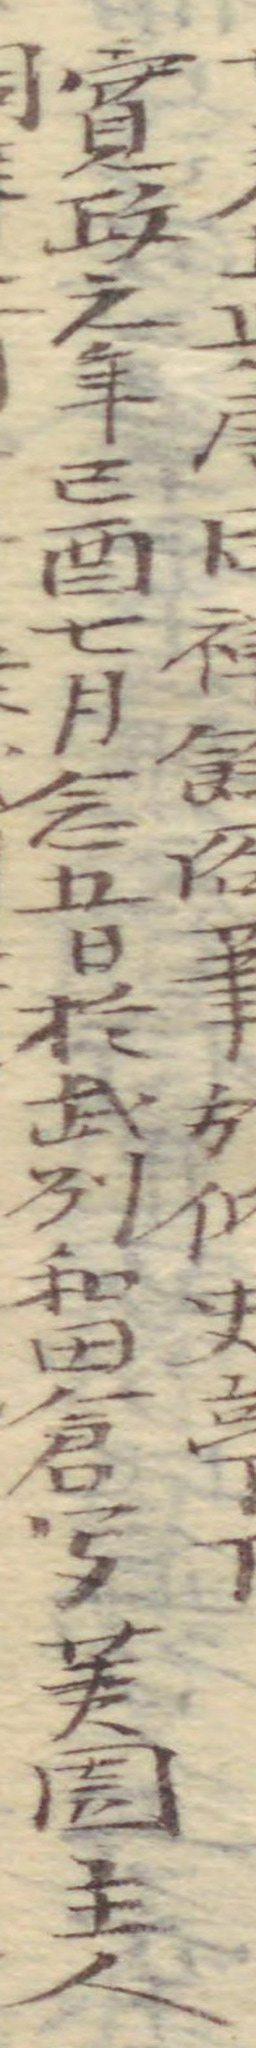寛政元年己酉七月念五日於武州和田倉写芙園主人
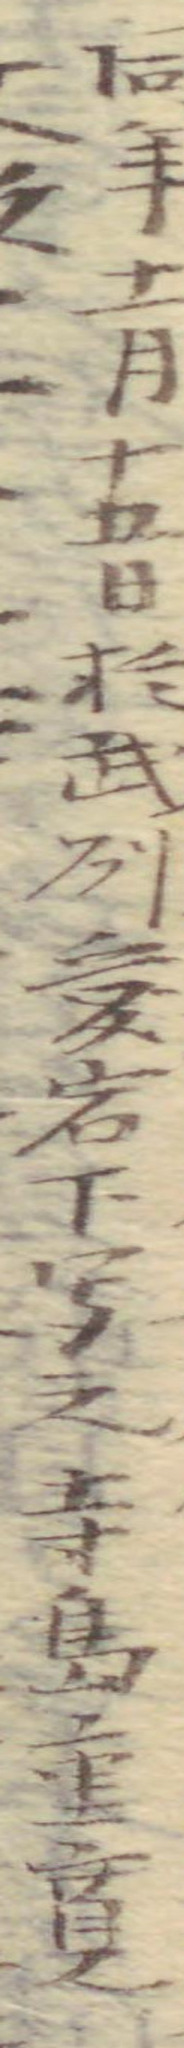同年十一月十五日於武州愛宕下写之寺島重寛
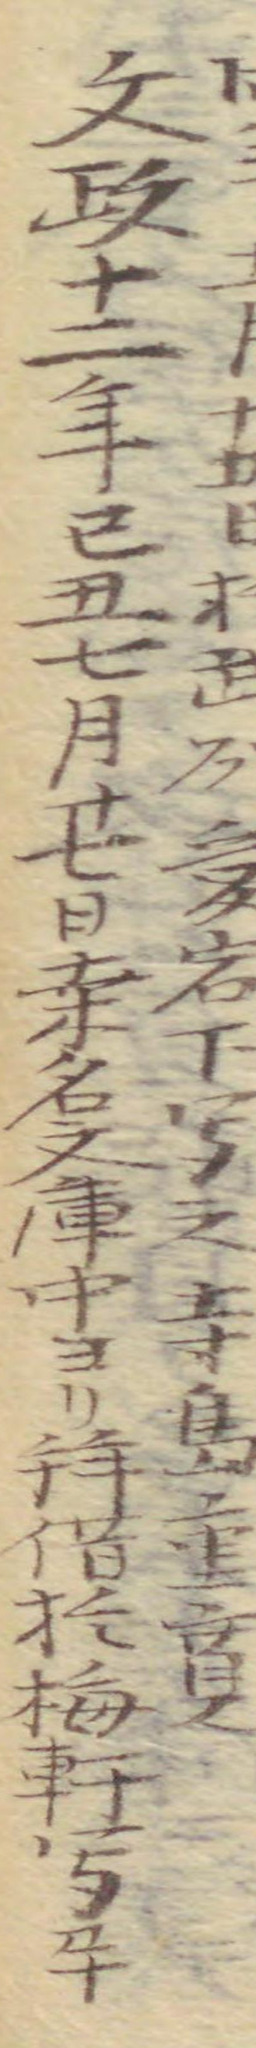文政十二年己丑七月廿七日桑名文庫中ヨリ拝借於梅軒写畢
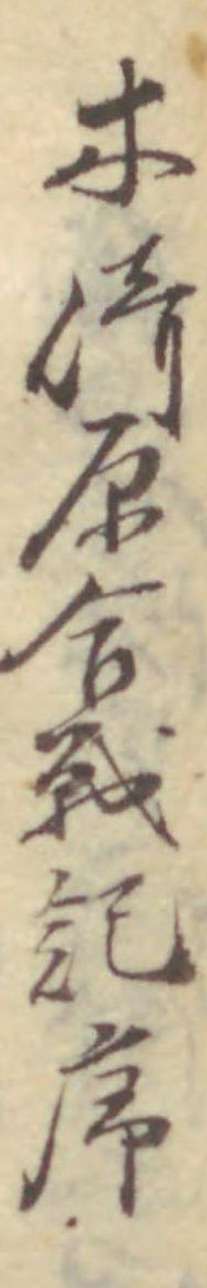木崎原合戦記序
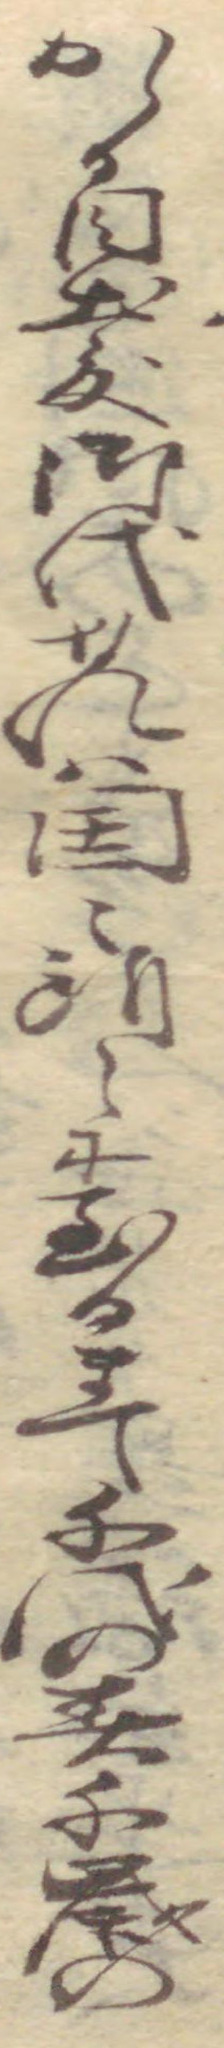かゝる目出度御代なれは国々所々に至るまて千代の春千歳の
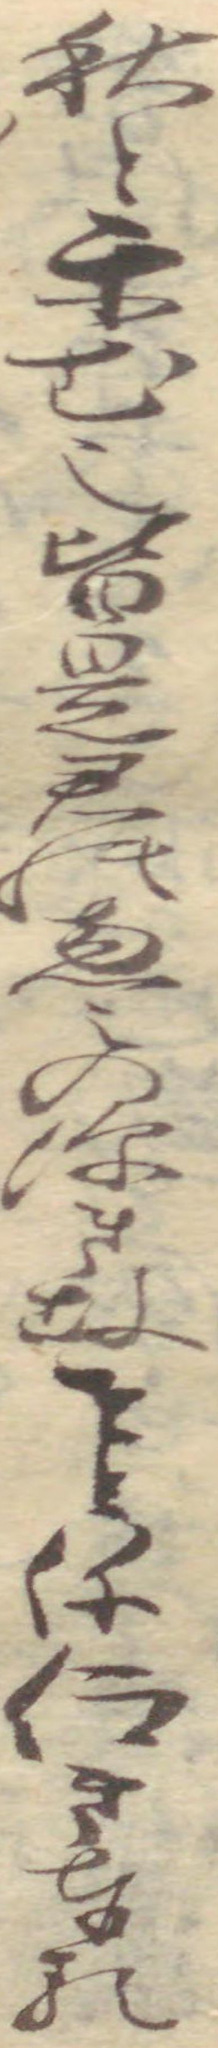秋と楽む也皆是君の恵みの深き故そと弥仰き奉る
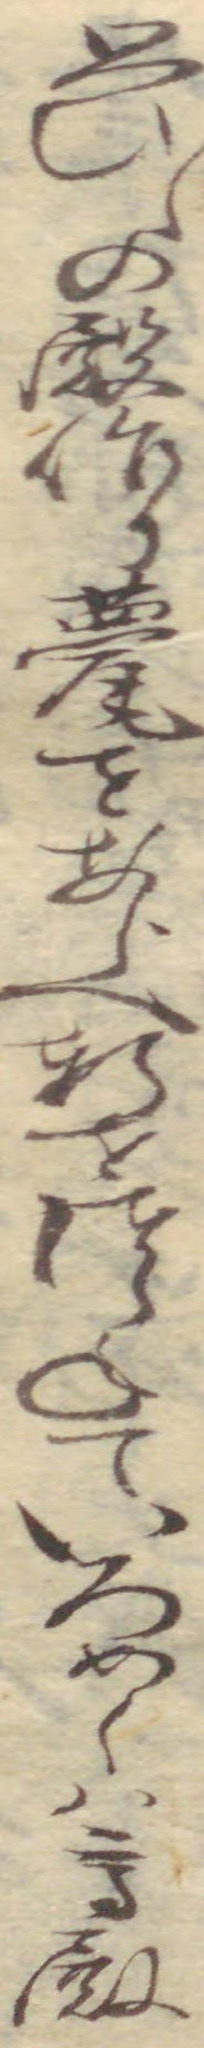思ひゝの殿作り甍をならへ軒をつらねていろめくは高殿
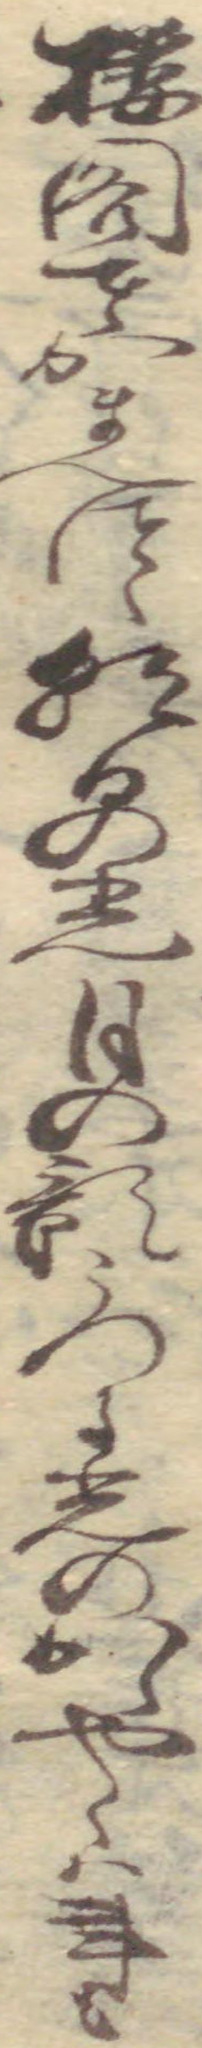楼閣をかまへつゝ朝日の光月の影うつる光のかゝやくは事も
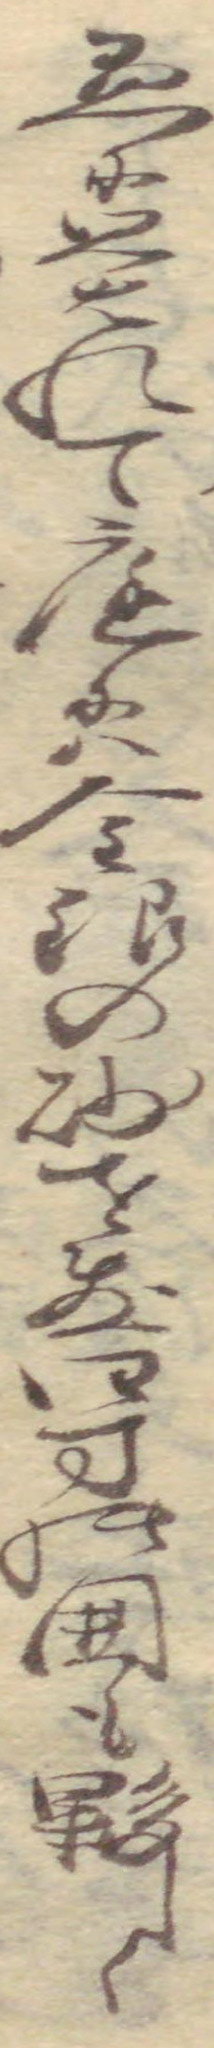愚に思はれて庭には金銀の砂を敷四方の囲も夥しく
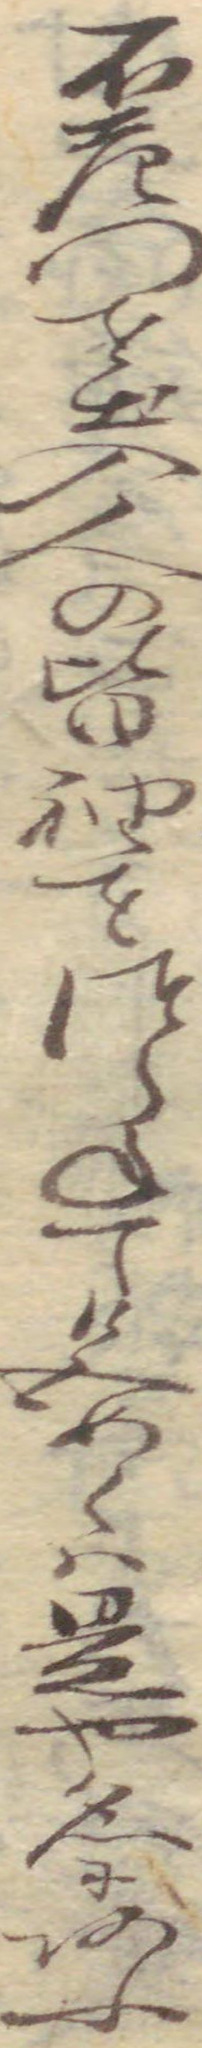不老門を出入人の皆袖をつらねて色めくは是や名にあふ
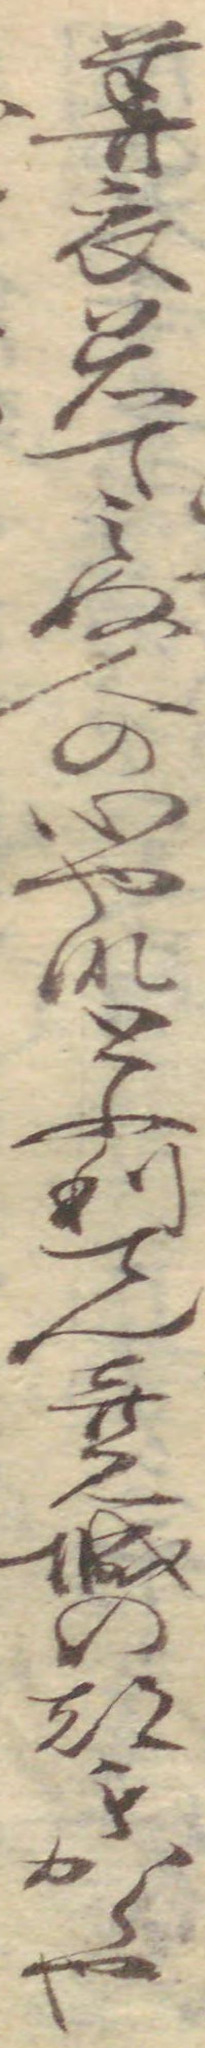華衣着てみぬ人の心やなとふりてん喜見城の都もかくや
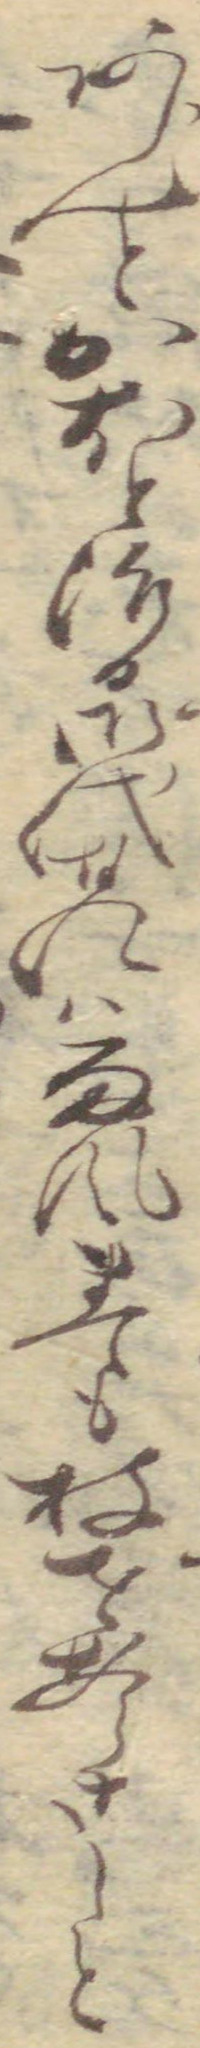あらんとかほと治る御代なれは雨風まても枝をならさしと
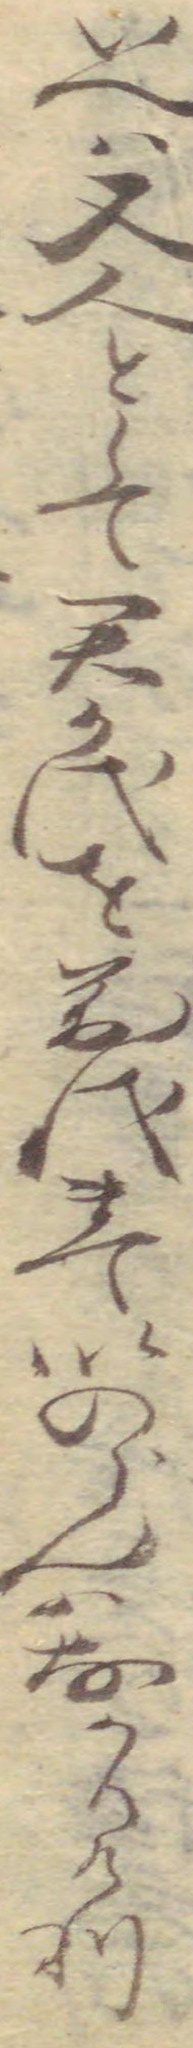いへは又人として君か代を萬代まていのらんはなかりけり

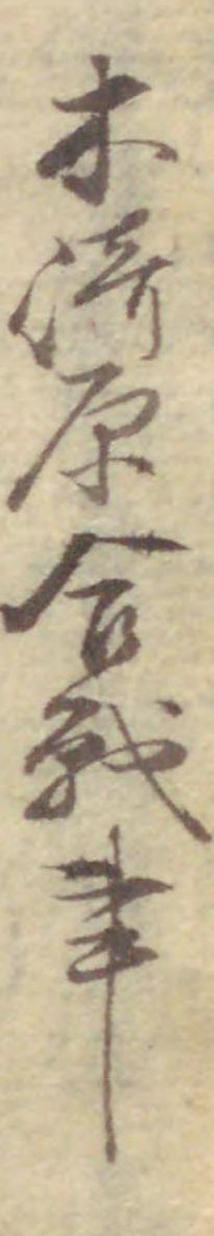木崎原合戦事
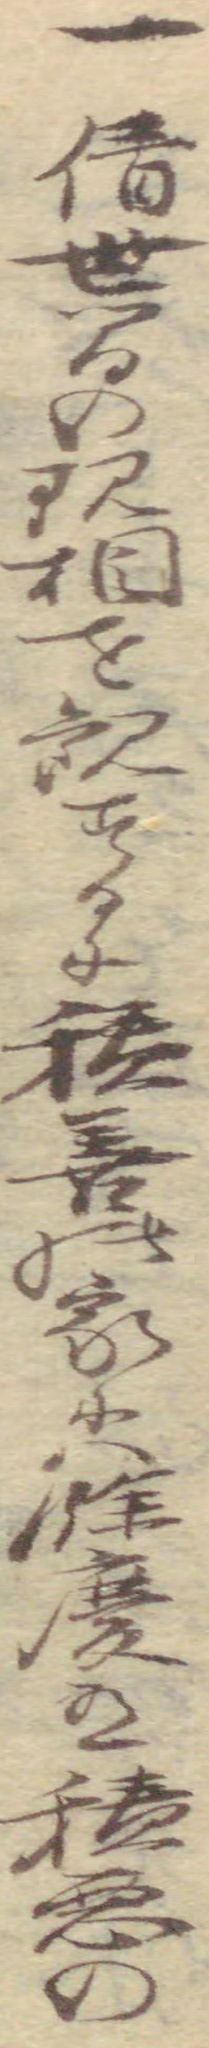一倩世間の現相を観するに積善の家には余慶有積悪の
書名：鶯宿雑記. 巻199-200
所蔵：国立国会図書館 National Diet Library, JAPAN
